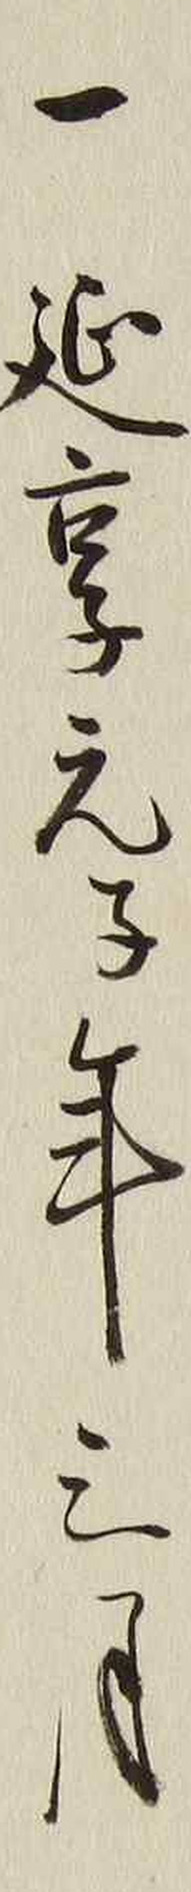一延享元子年三月
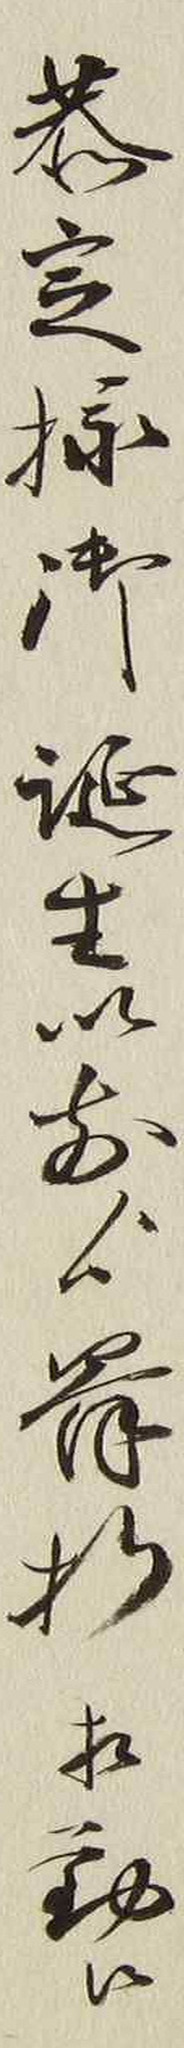恭定様御誕生以前ゟ骨折相勤候
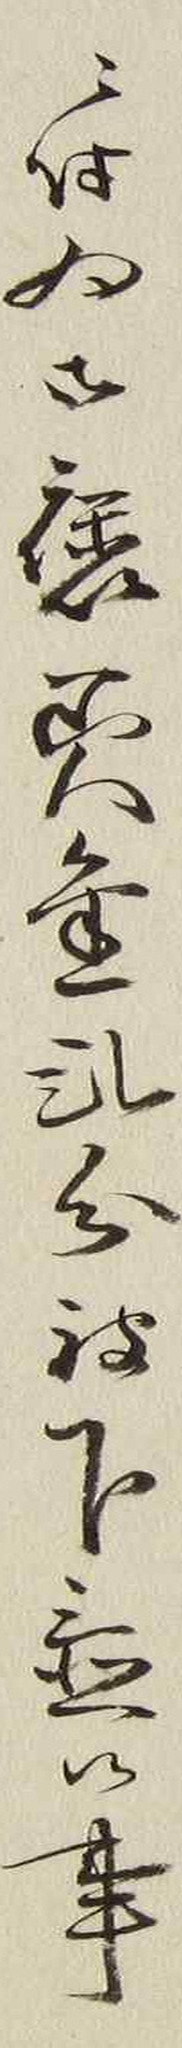ニ付為御褒美金弐分被下置候事
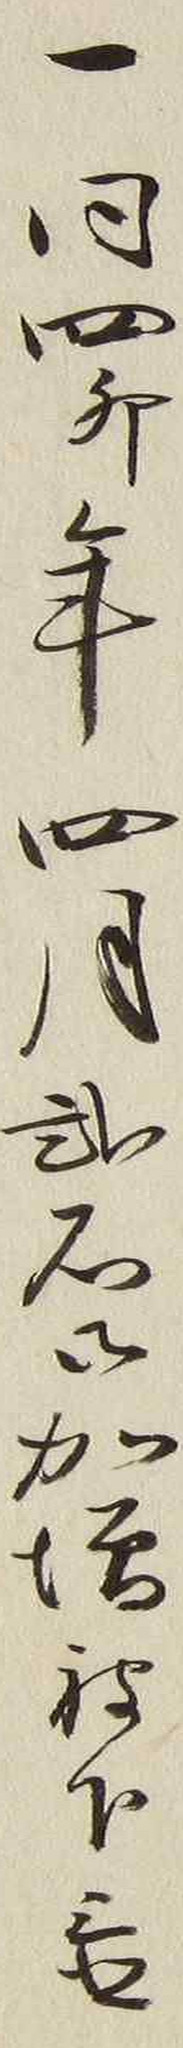一同四卯年四月弐石御加増被下置

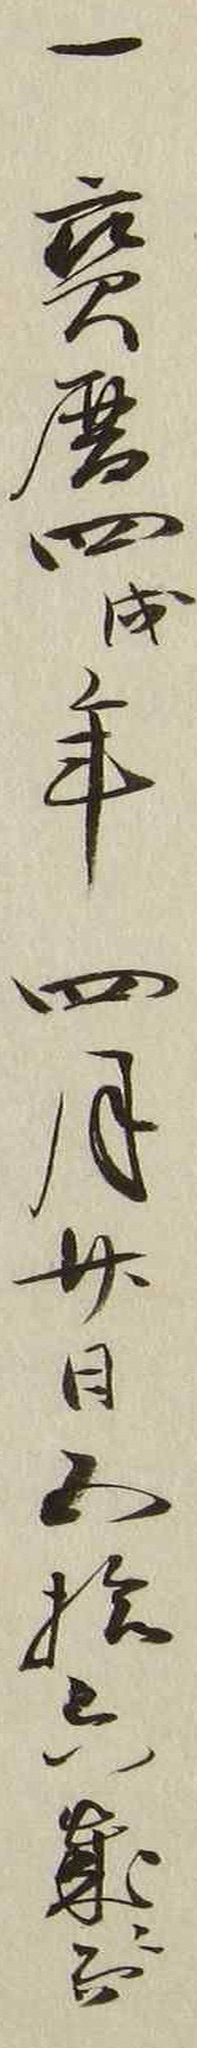一宝暦四戌年四月廿日五拾六歳ニ而
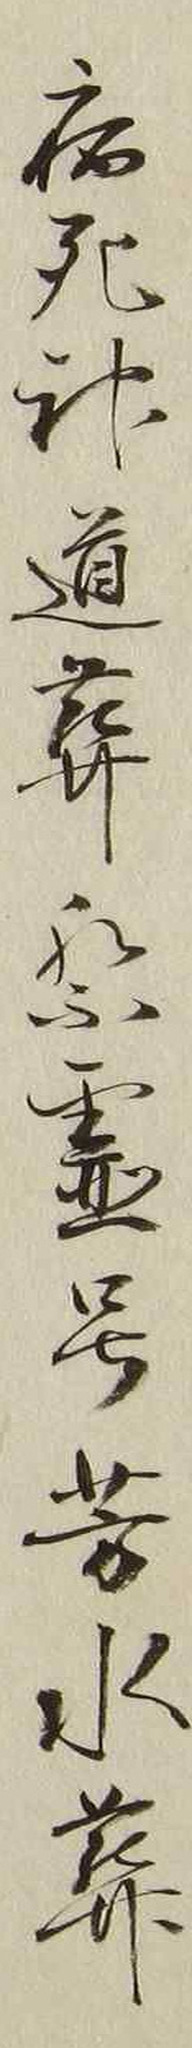病死神道葬祭霊号芳水葬
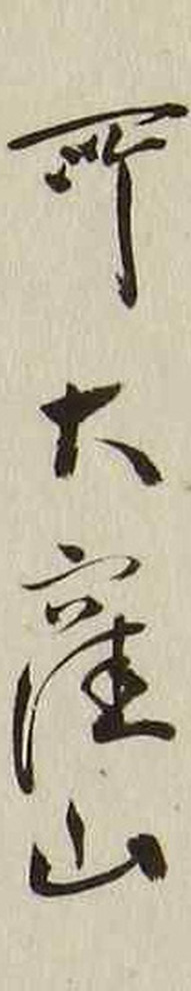所大窪山
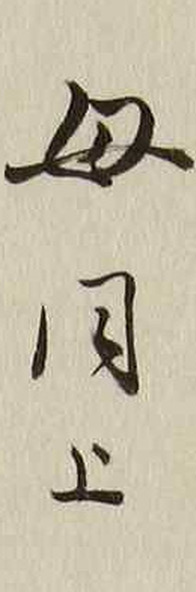母同上
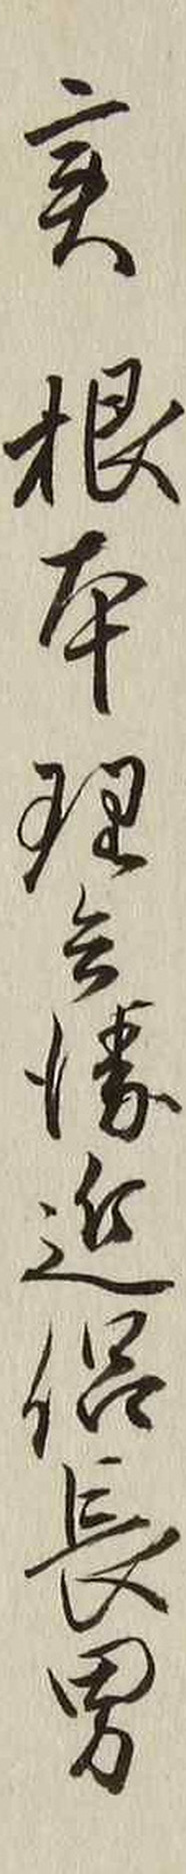実根本理兵衛近侶長男
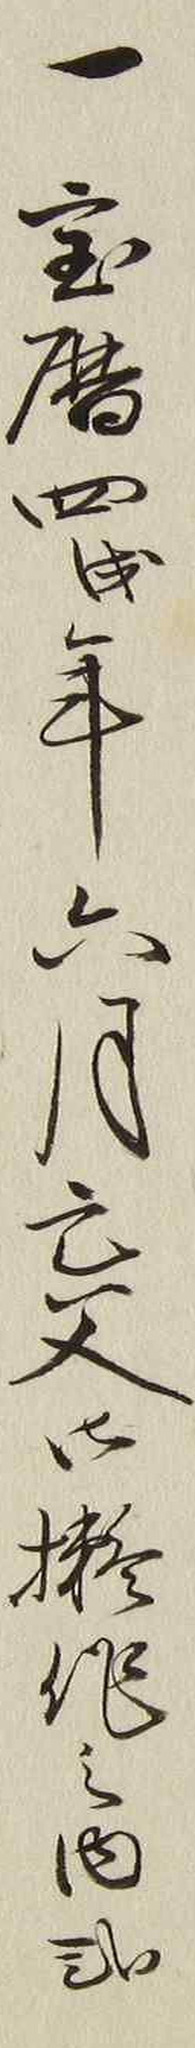一宝暦四戌年六月亡父御擬作之内弐
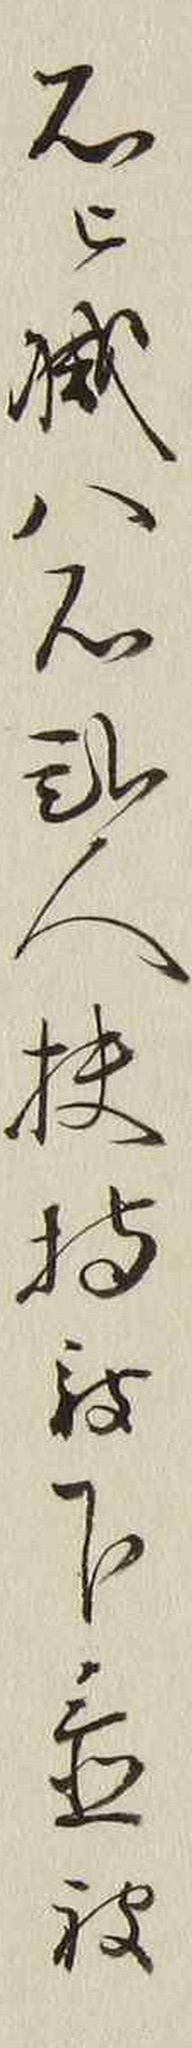石被減八石弐人扶持被下置被
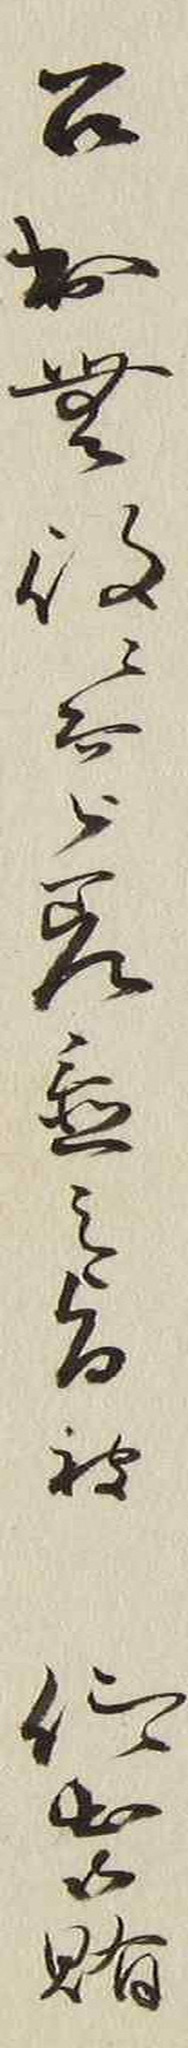召出無役ニ而被差置之旨被仰出御賄
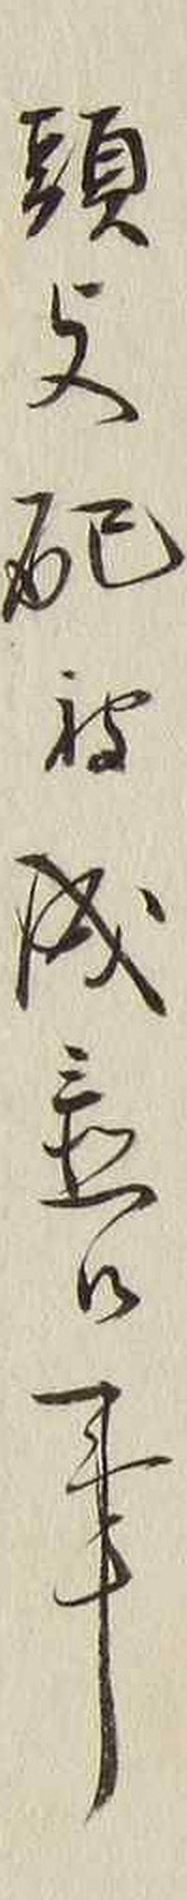頭支配被成置候事
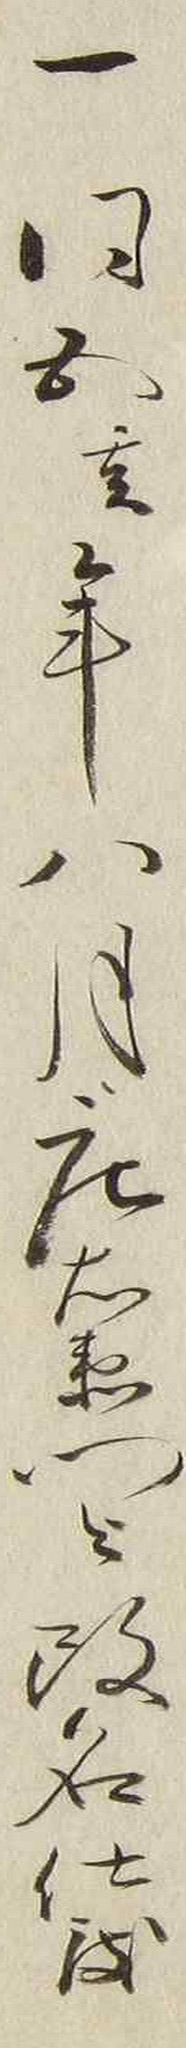一同五亥年八月庄右衛門と改名仕度

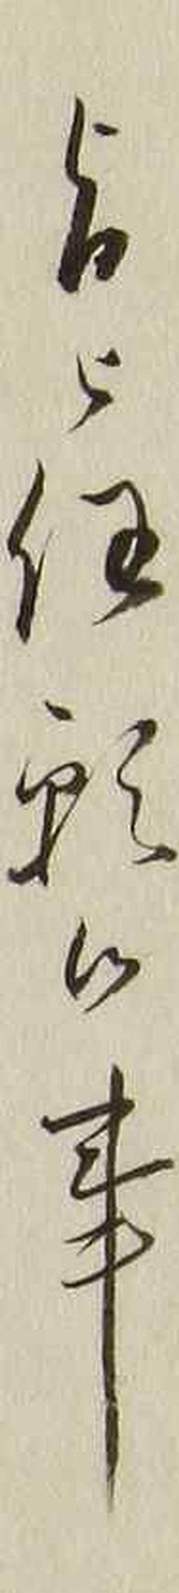旨被任願候事
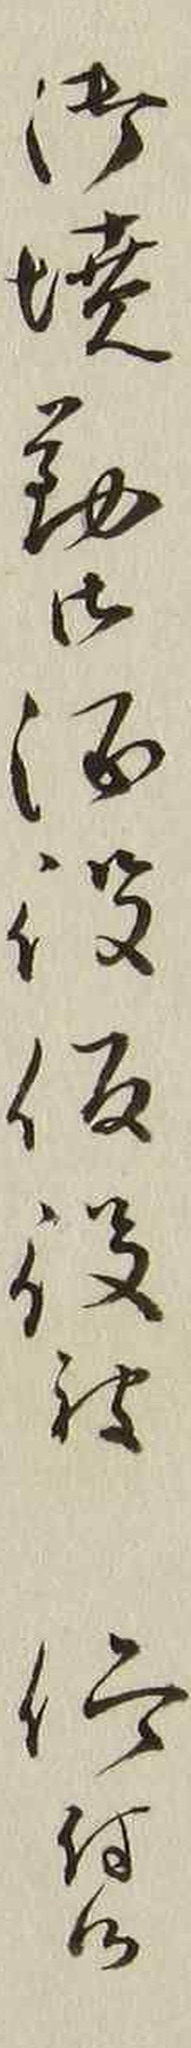御墳勤御酒役仮役被仰付候
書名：諸士系譜　巻之163　な之部5
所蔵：会津若松市立会津図書館
